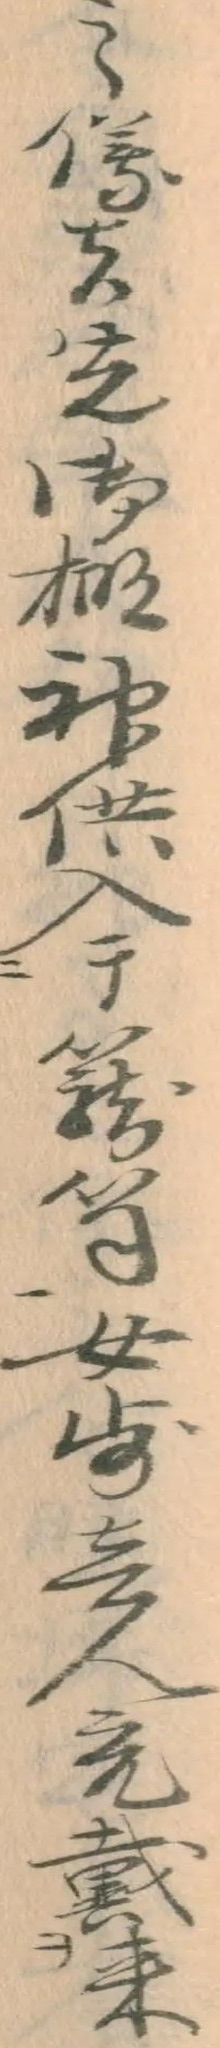之儀は先御棚神供入于籠笥女歩壱人充戴来
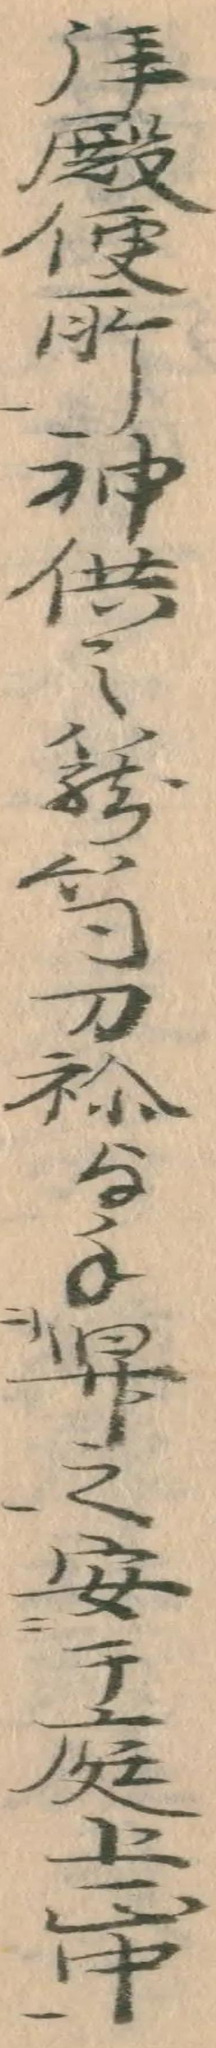拝殿便所神供之籠笥刀祢与手舁之安于庭上正中
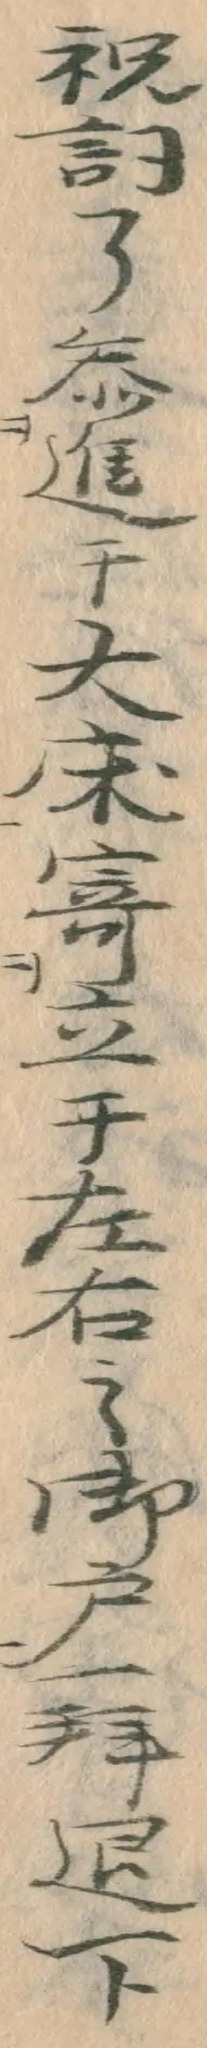祝詞了参進于大床寄立于左右之御戸一拜退下
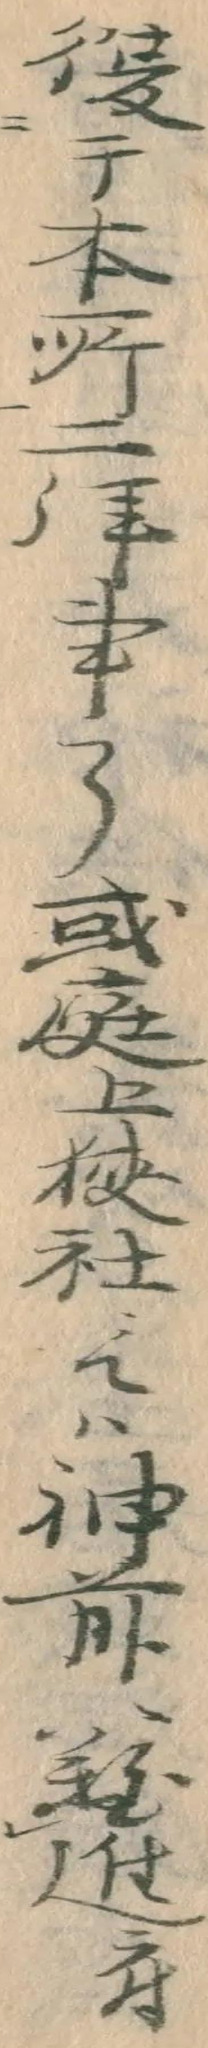復于本所二拝事了或庭上狭社ニてハ神前ヘ難進ニ付
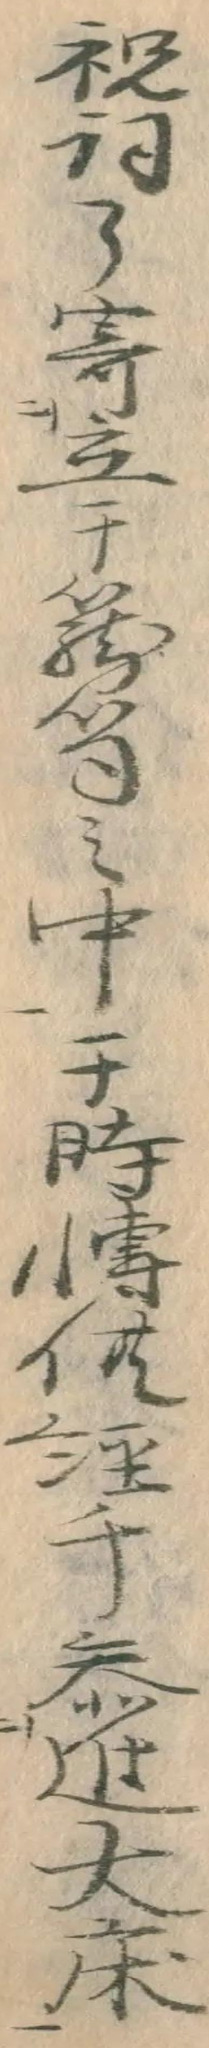祝詞了寄立于籠笥之中于時轉供経千参進大床
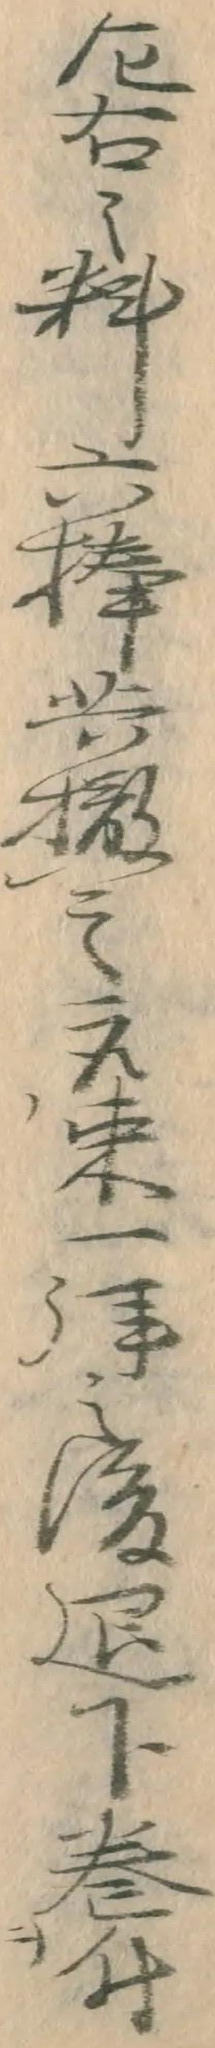左右之料六棒共撒之取束一拝之後退下巻付

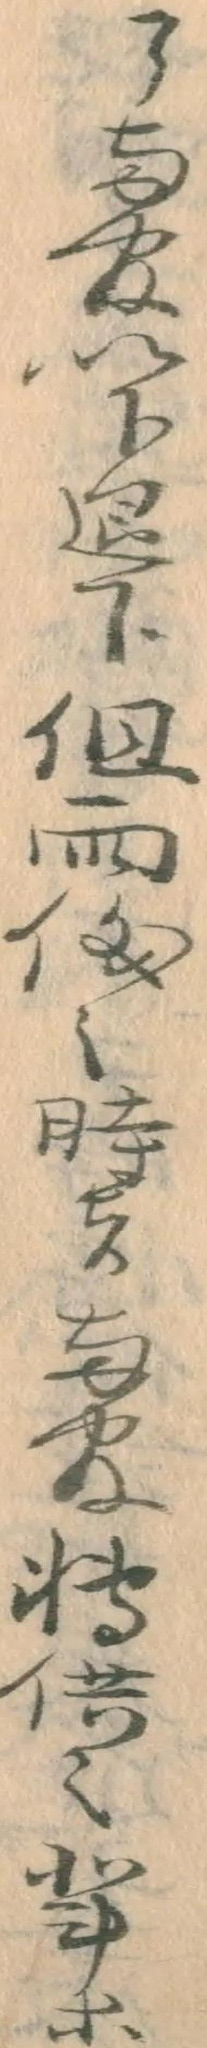了両官以下退下但雨儀之時は両官轉供之輩等
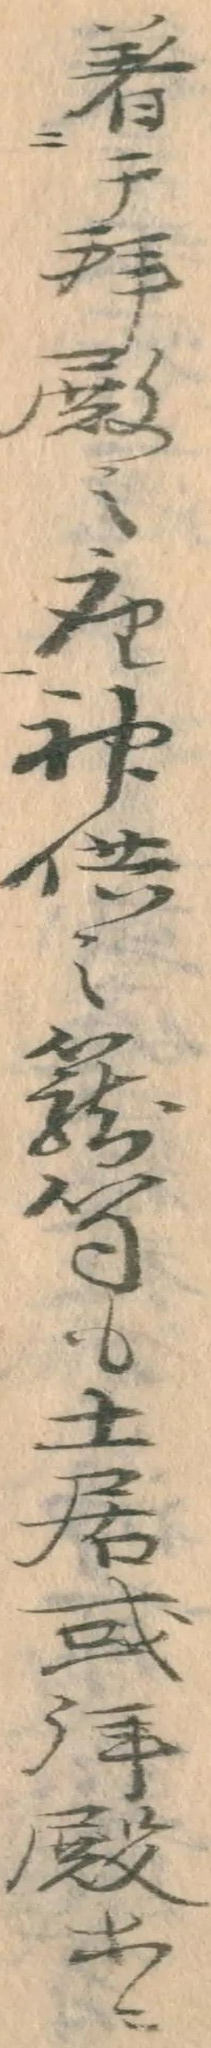着于拝殿之座神供之籠笥も土居或拝殿等ニ
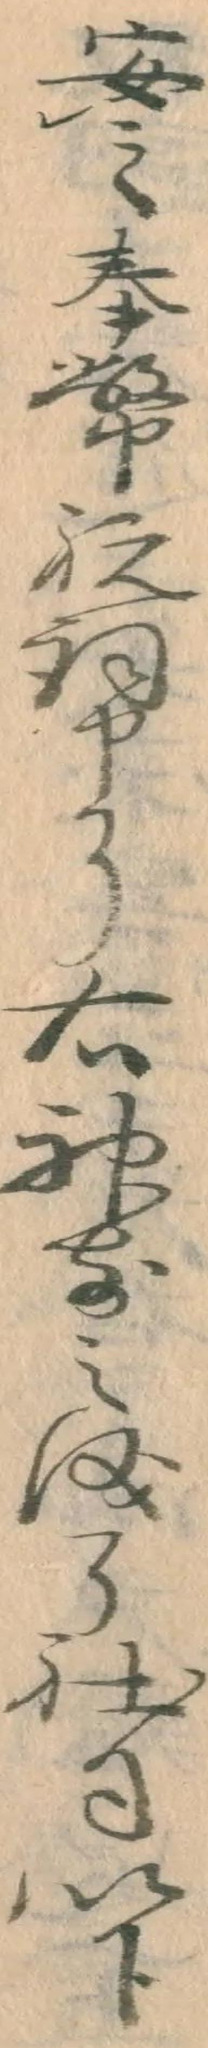安之奉幣祝詞申了右神前之儀了社司以下
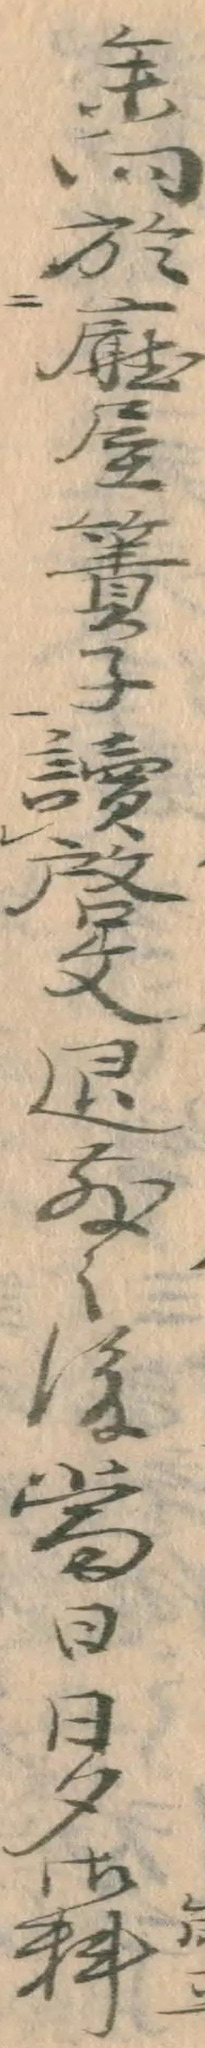参向於廰屋簀子讀啓文退散之後當日日夕御料
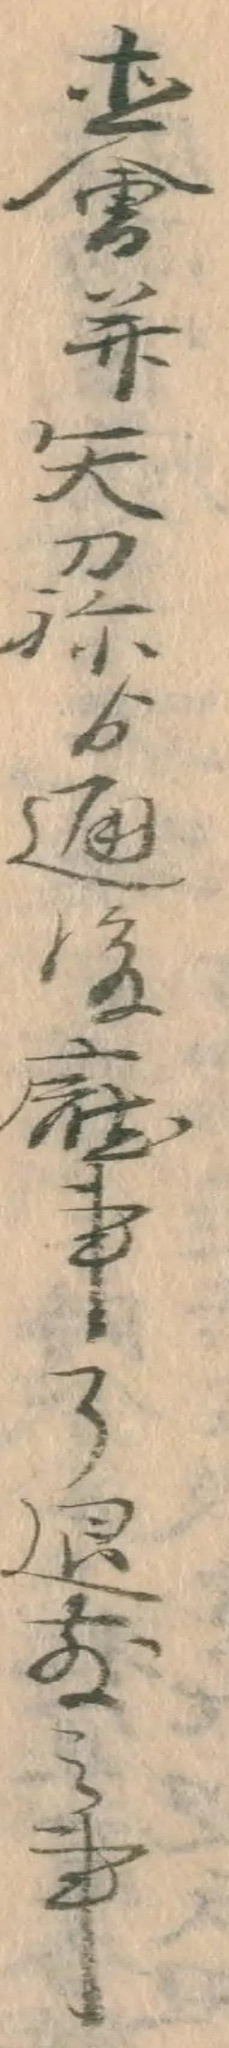直會并矢刀祢ゟ通後廰事了退散之事
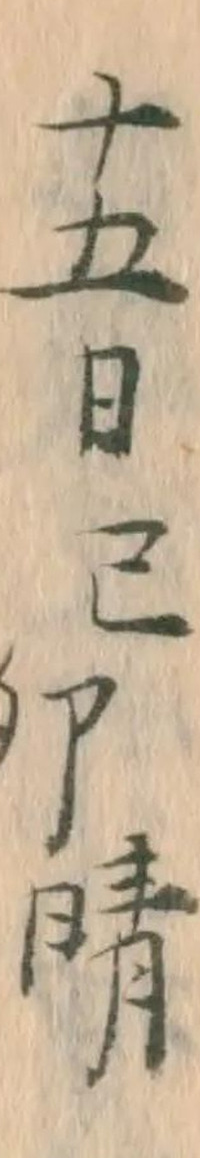十五日己卯晴
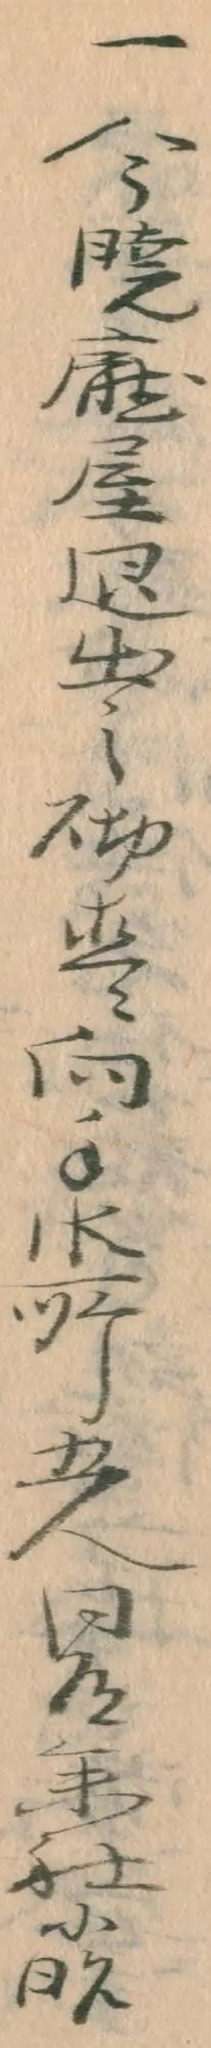一今暁廰屋退出之砌直ニ向手水所五人同道未社小昨
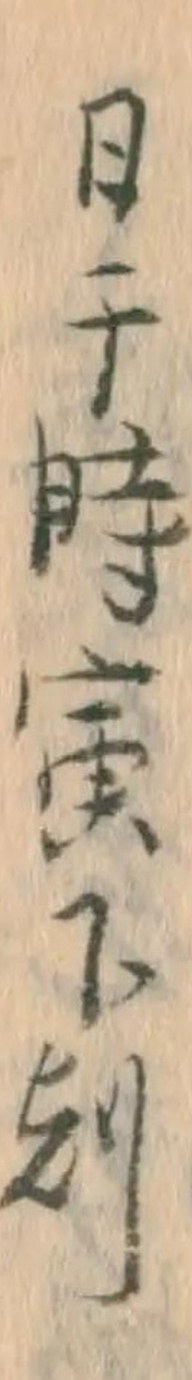日于時寅下刻
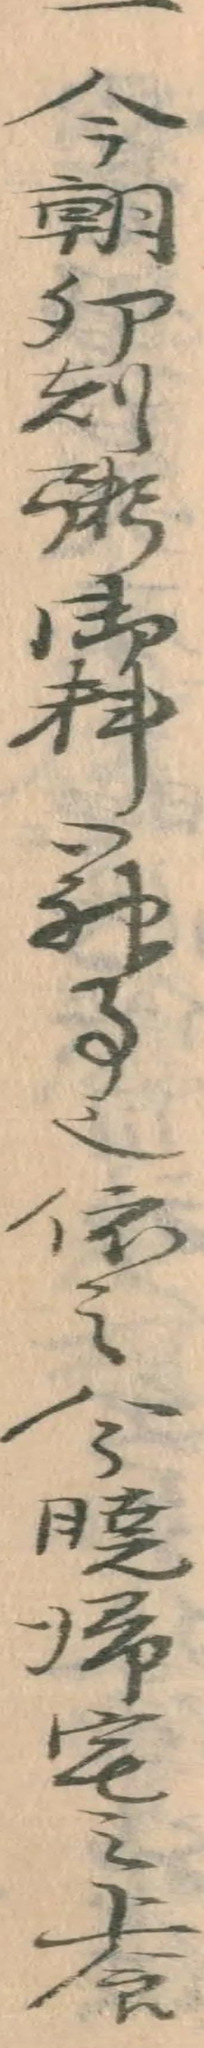一今朝卯刻粥御料御神事也依之今暁帰宅之上食
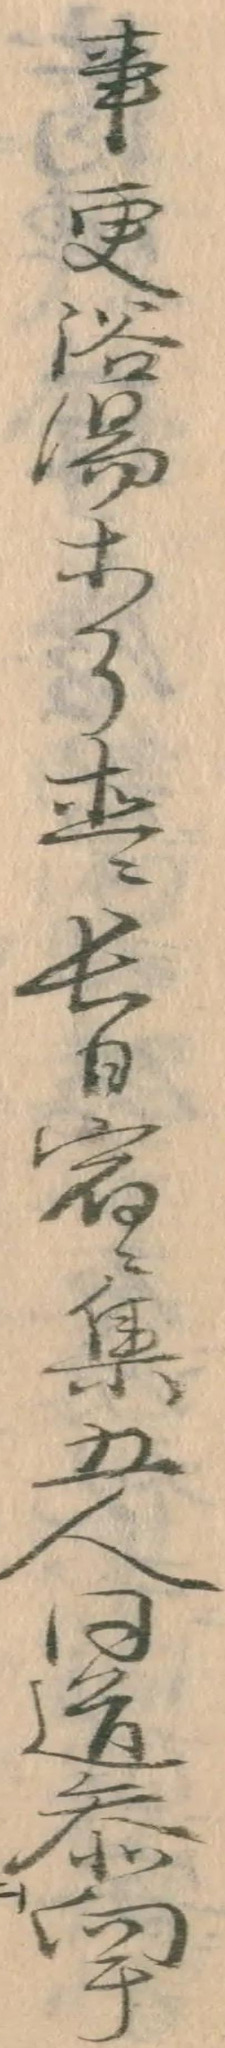事更浴湯等了直ニ長日宿ニ集五人同道参向于
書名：賀茂社記録. 第72冊
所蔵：国立国会図書館 National Diet Library, JAPAN
